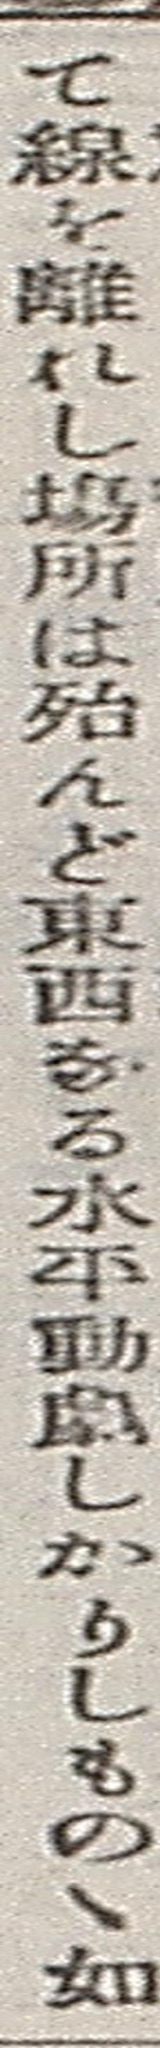て線を離れし場所は殆んど東西なる水平動劇しかりしものゝ如
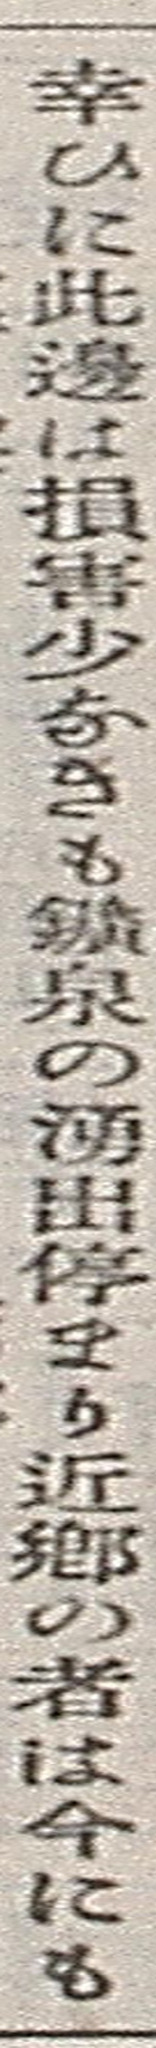幸ひに此辺は損害少なきも鉱泉の湧出停まり近郷の者は今にも
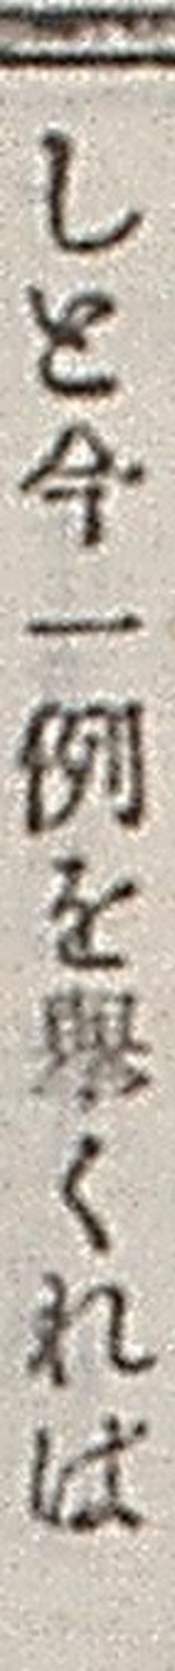しと今一例を挙くれは
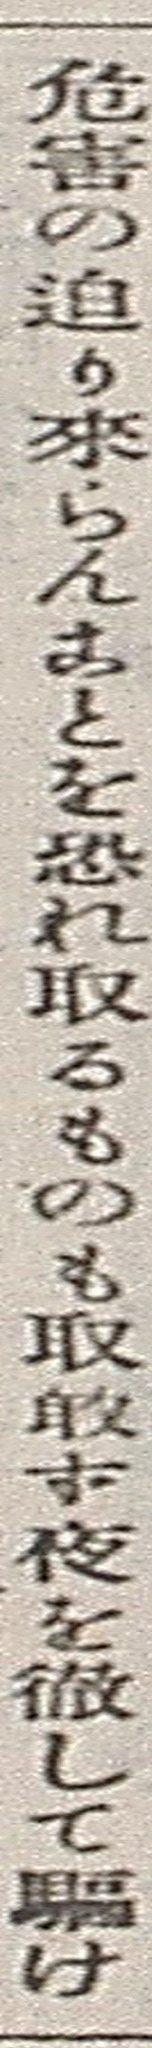危害の迫り来らんことを恐れ取るものも取敢ず夜を徹して駆け
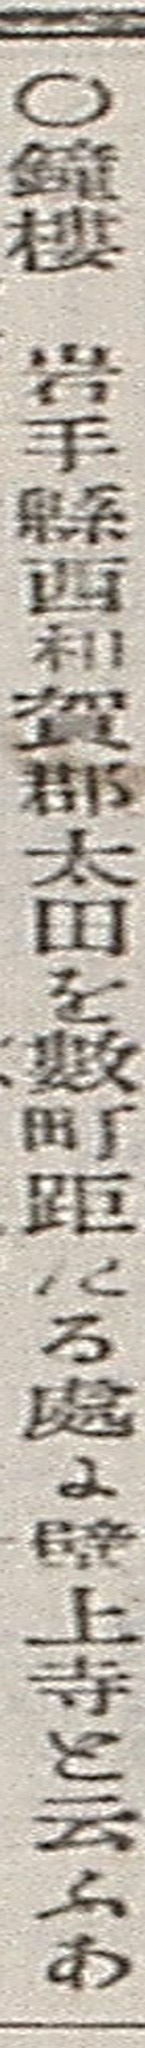〇鐘楼岩手県西和賀郡太田を数町距たる処に壁上寺と云ふあ
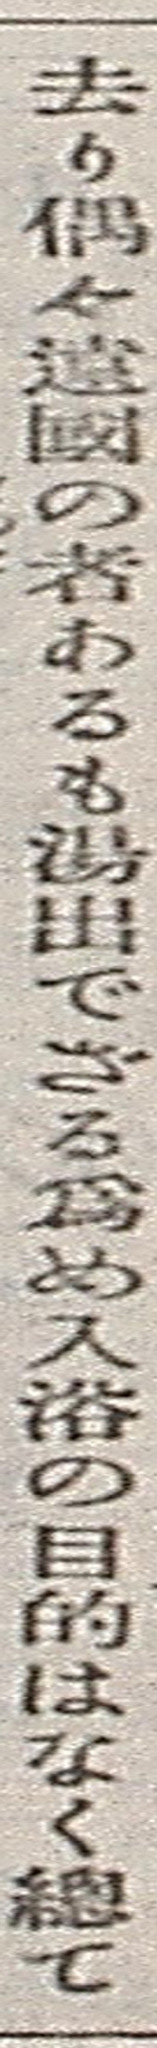去り偶々遠国の者あるも湯出でざる為め入浴の目的はなく総て
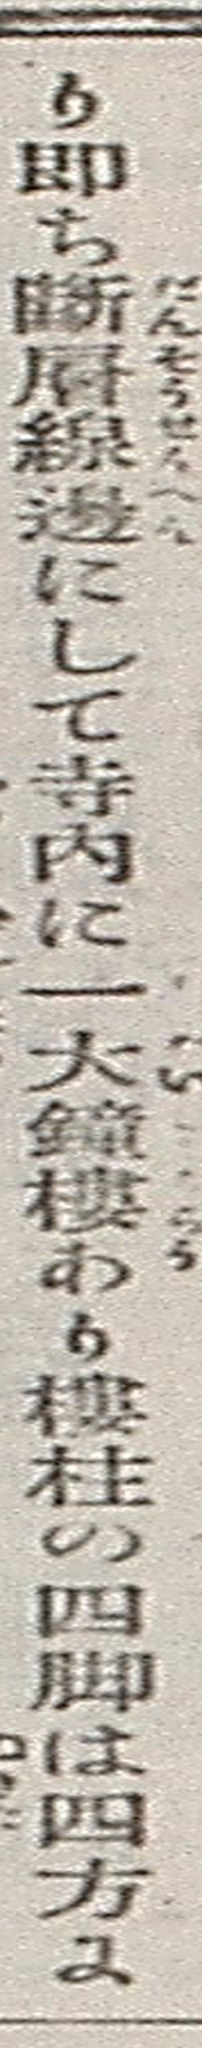り即ち断層線辺にして寺内に一大鐘楼あり楼柱の四脚は四方に
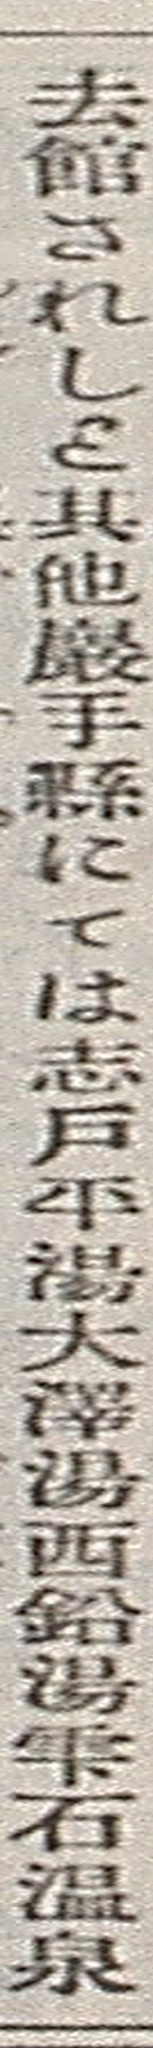去館されしと其他岩手県にては志戸平湯大沢湯西鉛湯雫石温泉
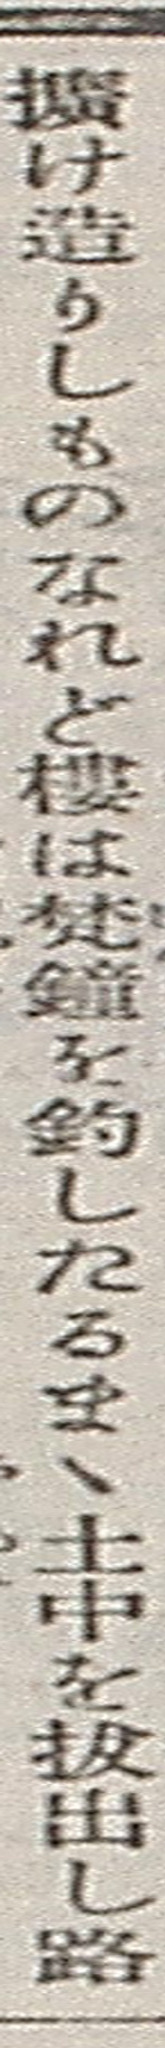拡け造りしものなれど楼は梵鐘を釣したるまゝ土中を抜出し路
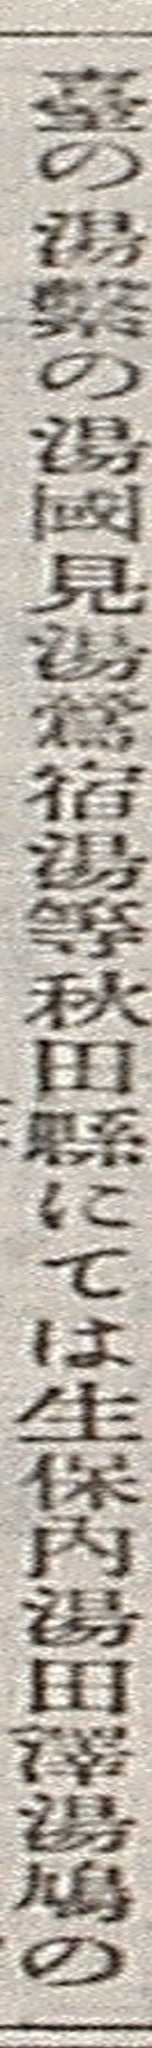台の湯繋の湯国見湯鶯宿湯等秋田県にては生保内湯田沢湯鳩の
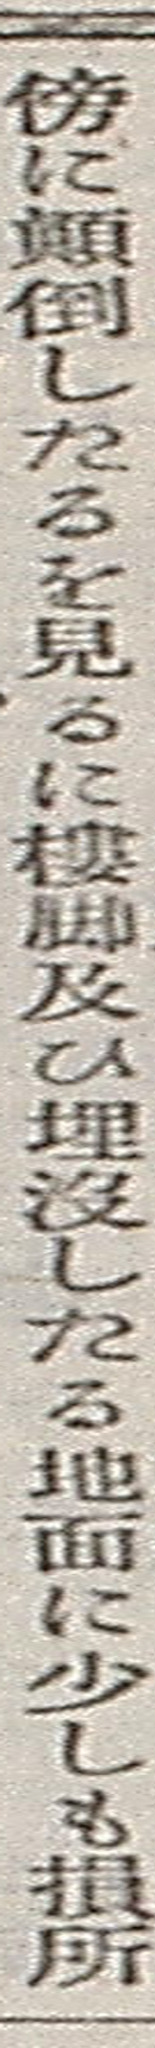傍に顚倒したるを見るに楼脚及ひ埋没したる地面に少しも損所
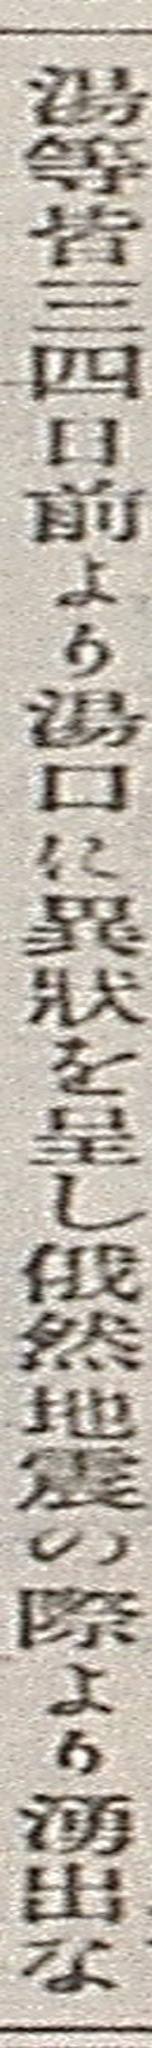湯等皆三四日前より湯口に異状を呈し俄然地震の際より湧出な
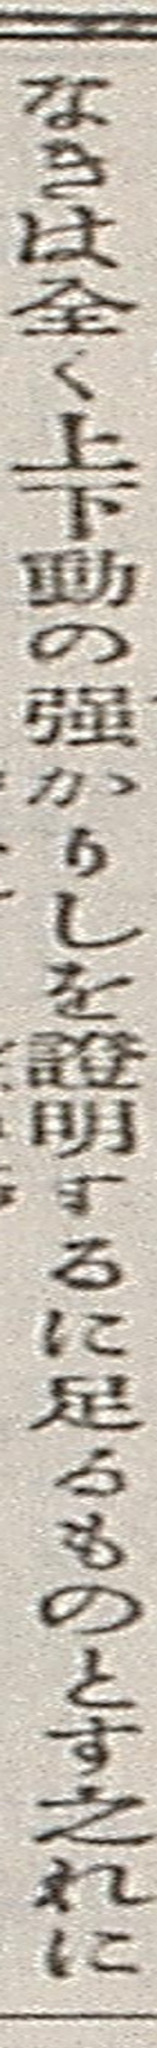なきは全く上下動の強かりしを証明するに足るものとす之れに
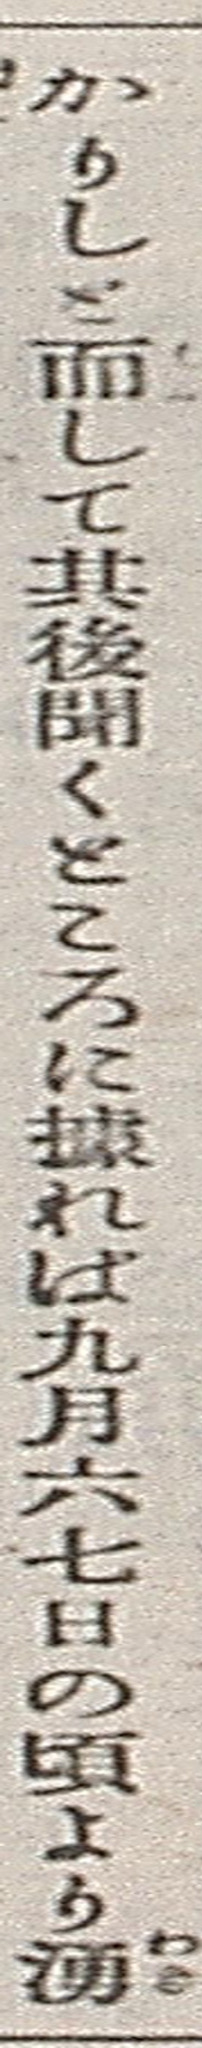かりしと而して其後聞くところに拠れば九月六七日の頃より湧
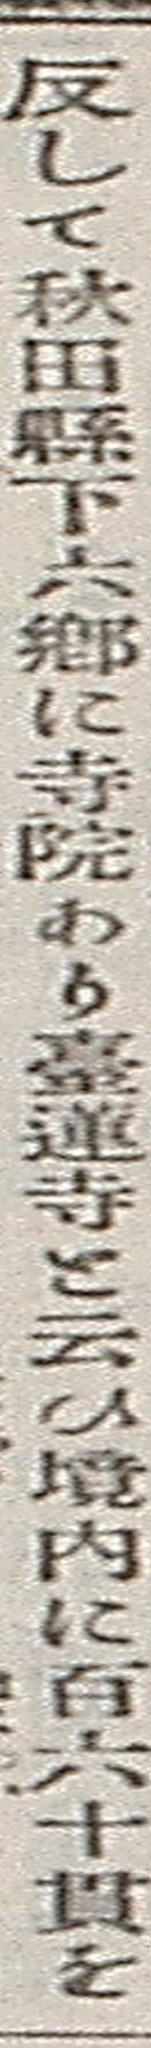反して秋田県下六郷に寺院あり台蓮寺と云ひ境内に百六十貫を
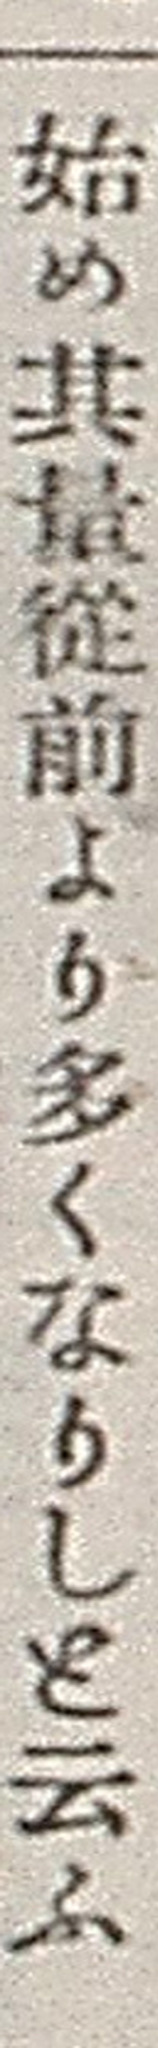始め其量従前より多くなりしと云ふ
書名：風俗畫報臨時増刊第百二十四號　洪水地震被害録（上）
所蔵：東京大学地震研究所図書室 Earthquake Research Institute Library, The University of Tokyo, JAPAN
